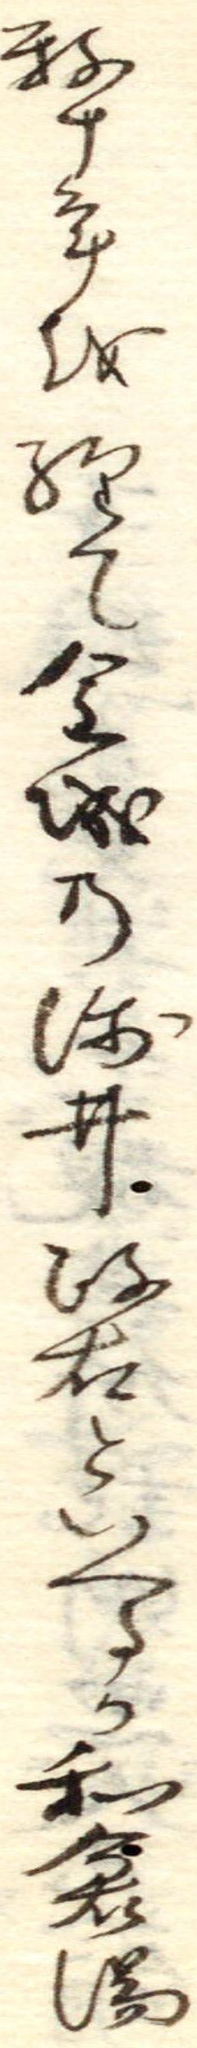数十年を経て金城の浅井政右といへるか和倉湯
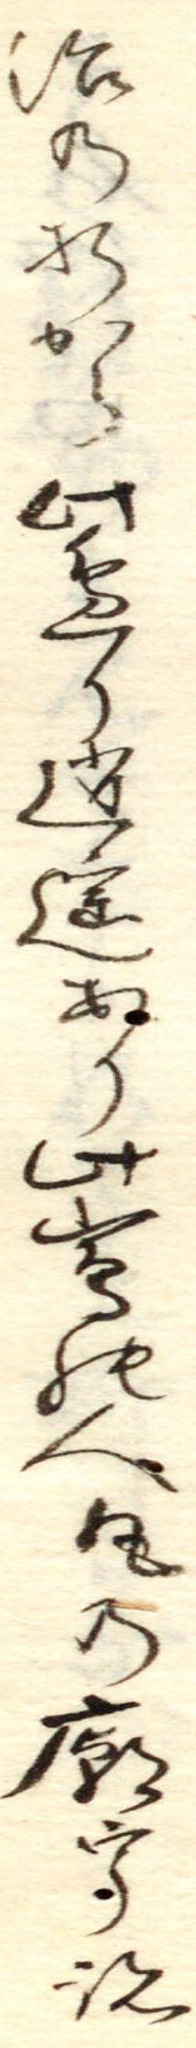治の折から此辺り逍遥あり此嶌の人凡の廓宇跡
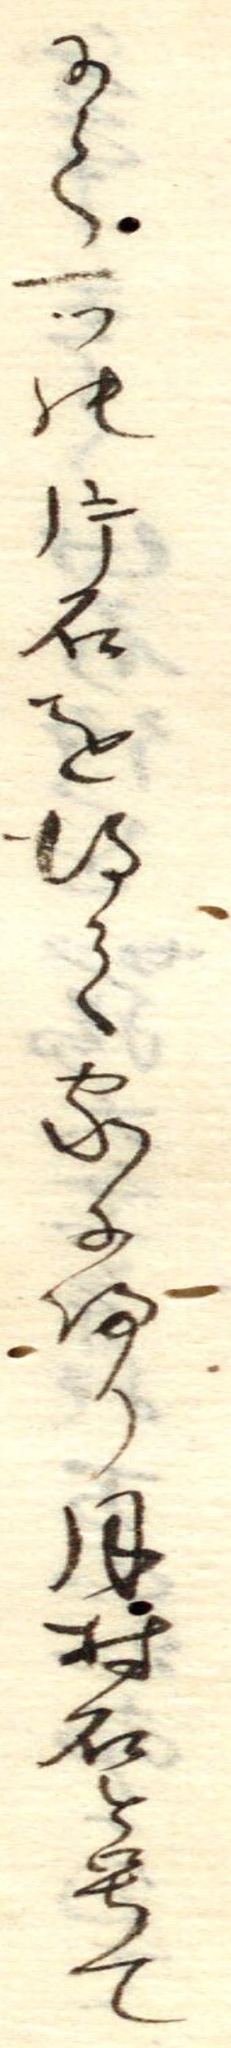にて一ッの片名を得て家に帰り月村名と号て

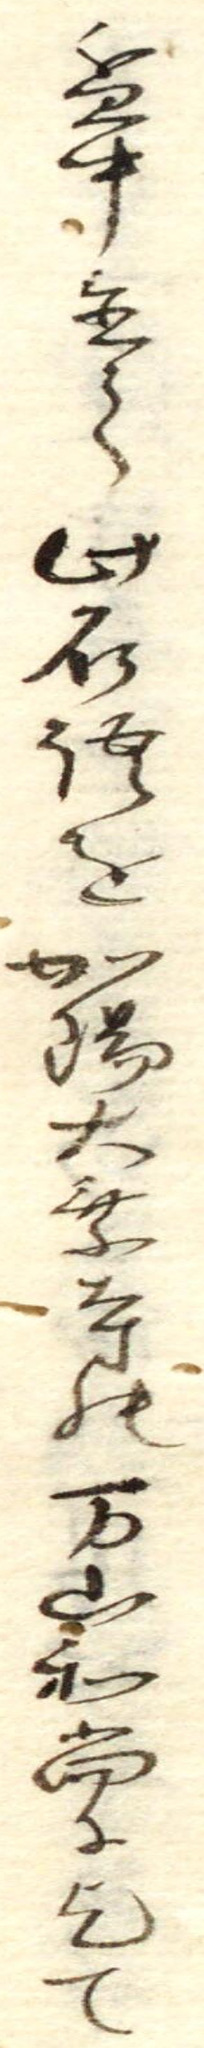盆中置て此石語を加陽大乗寺の万山和尚に乞て
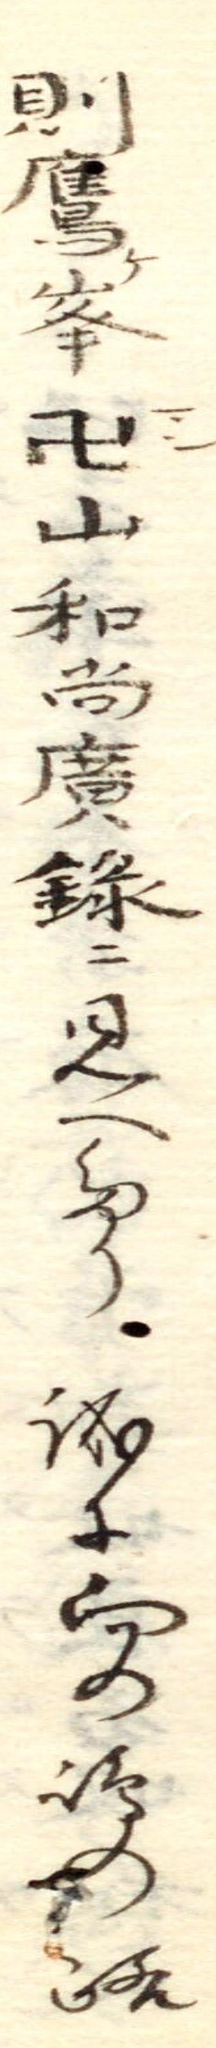則鷹峯卍山和尚広録見へたり誠に向の嶋の路
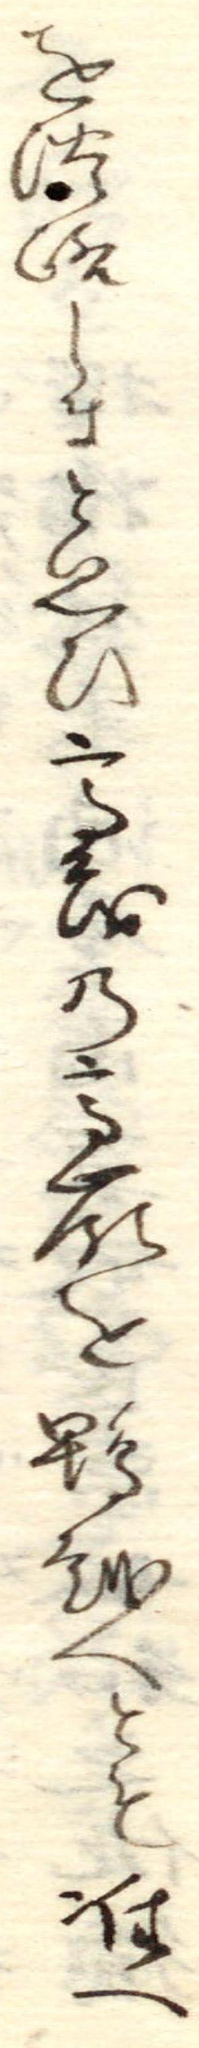を淡路しまと思ひ高茂の高嶺を鵯越へとも准へ
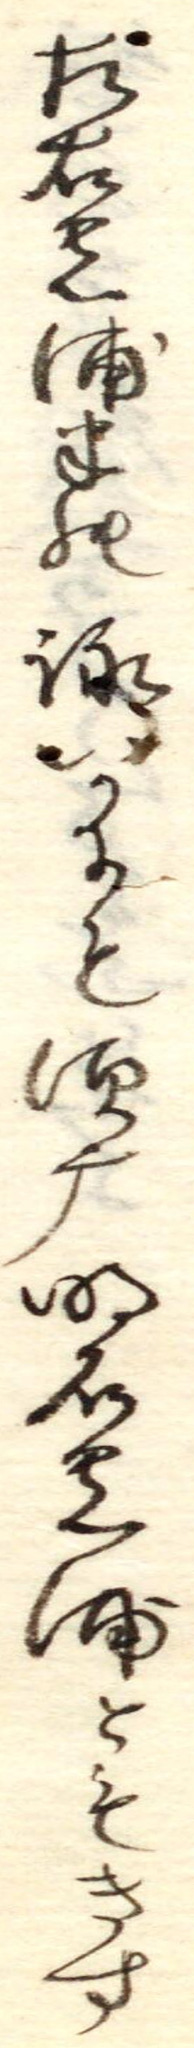左右の浦半の詠いかにも須磨明石の浦ともきす
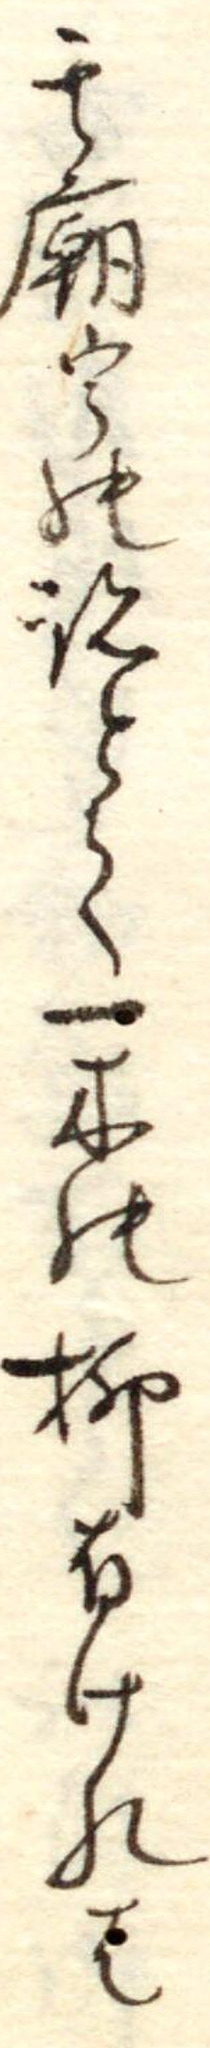其廟宇野の跡とて一木の柳有けれは
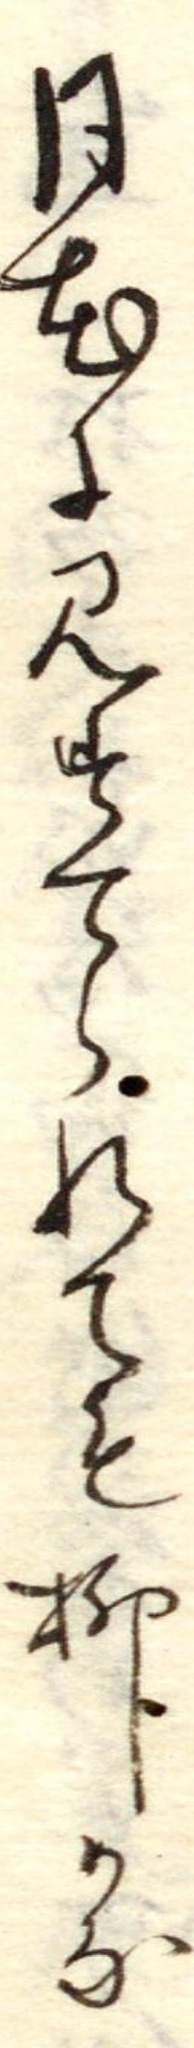月花に見すてられても柳かな

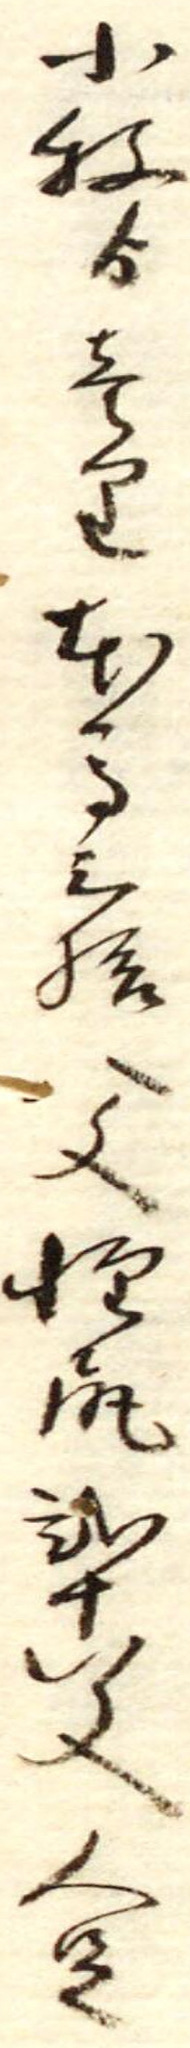小牧ゟ壱里本馬三拾八文軽尻弐十八文人足
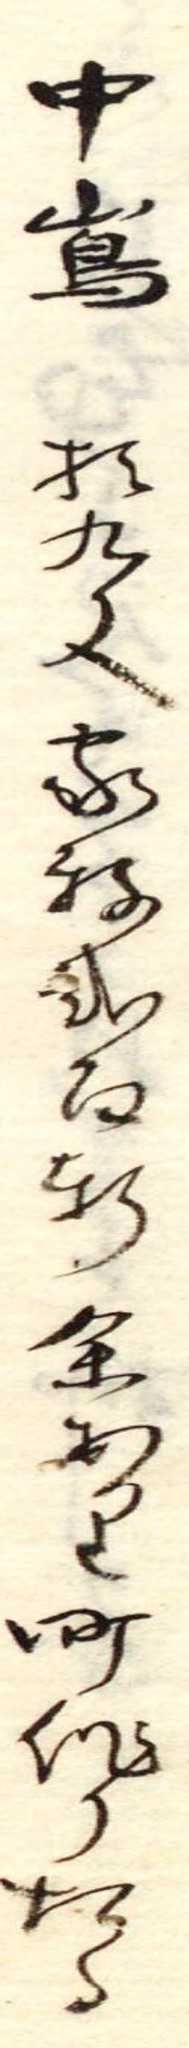中嶌十拾九文家数弐百軒余あり町作りたる
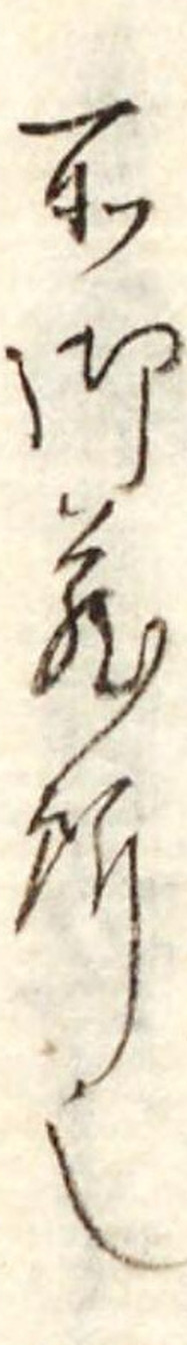所御蔵所也
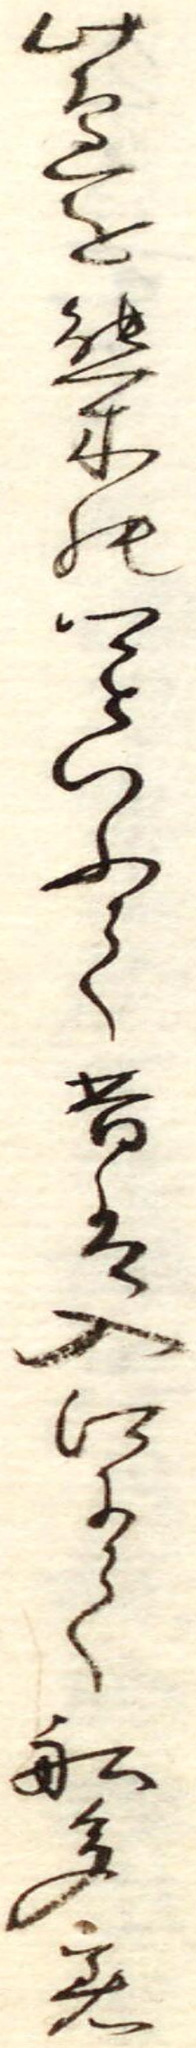此辺を熊木の郷といふて昔は入口にて船多着
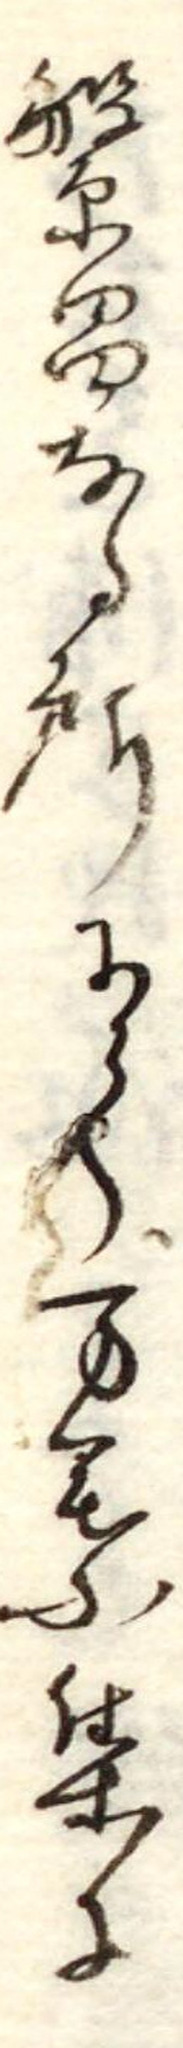繁昌なる所にて万葉集に
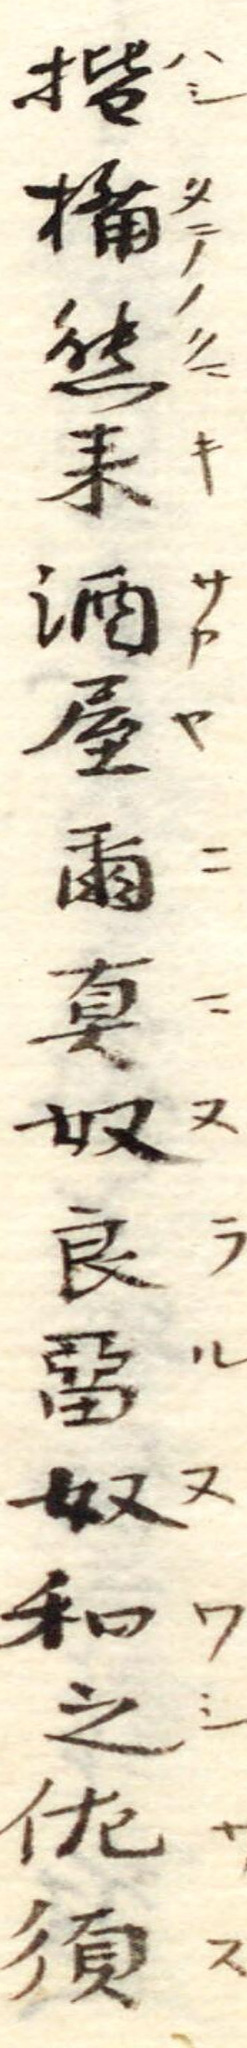楷楯熊木酒屋爾真奴良畱奴和之佐須
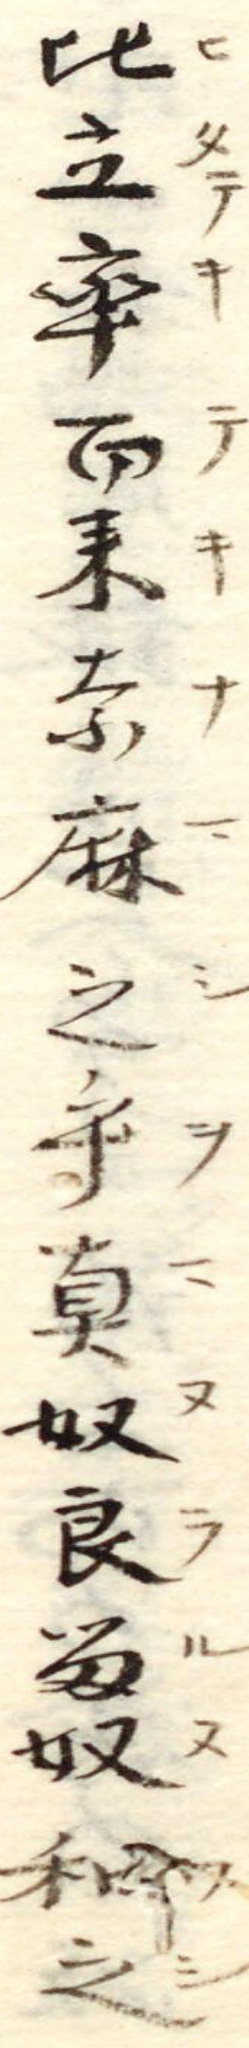比立率而来奈麻之乎真奴良留奴和之
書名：能登名跡誌
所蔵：Ishikawa Prefectural Library
